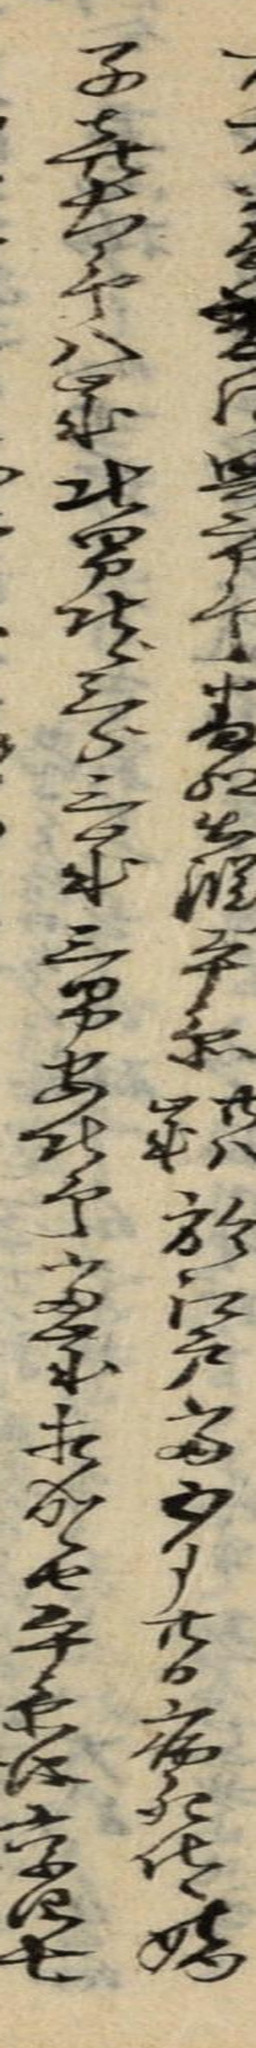子喜太郎八歳次男次郎三郎三歳三男安次郎当歳相成候由平兵衛儀享保七
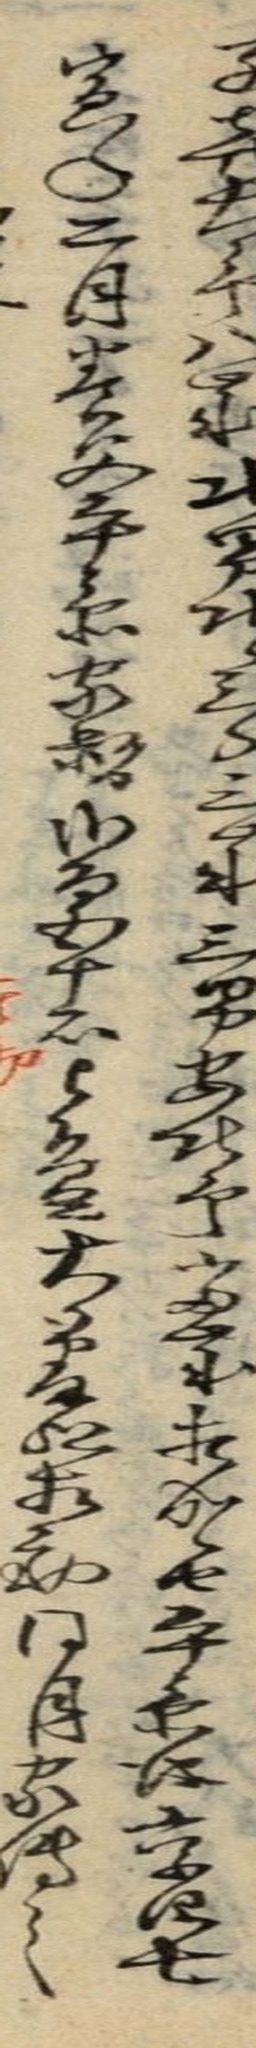寅年二月養父平兵衛家督弐百五十石被下置大御番組相勤同月家伝之
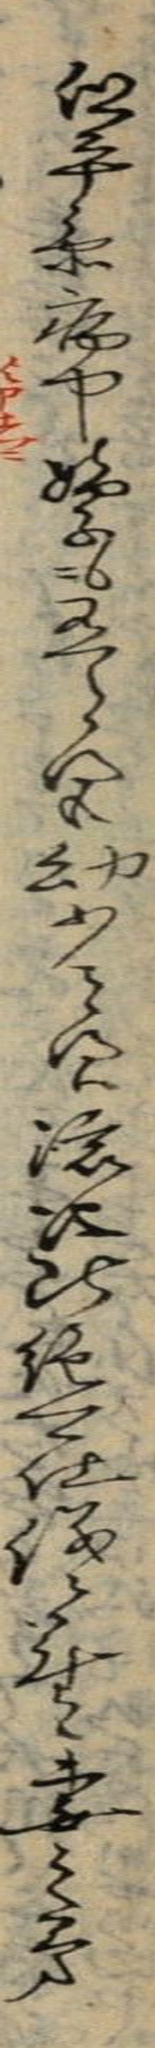但平兵衛病中嫡子も有之候得共幼少に候得は流儀断絶可仕儀に御座候妻之弟
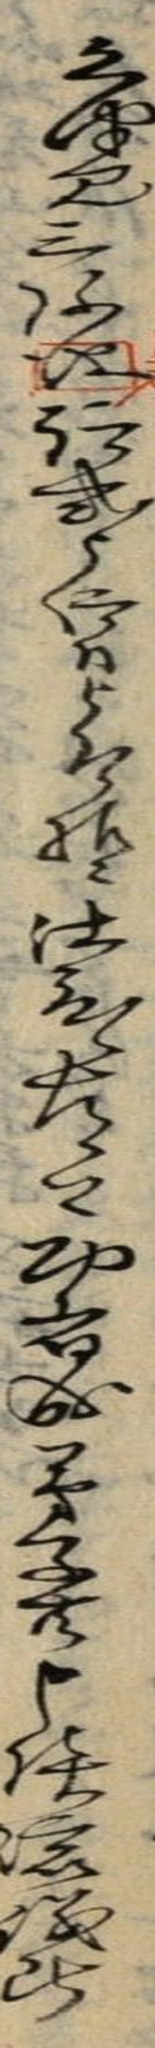久津見三弥儀跡式被仰付被下候様に仕度候左候はゝ功者成弟子共申談流儀断
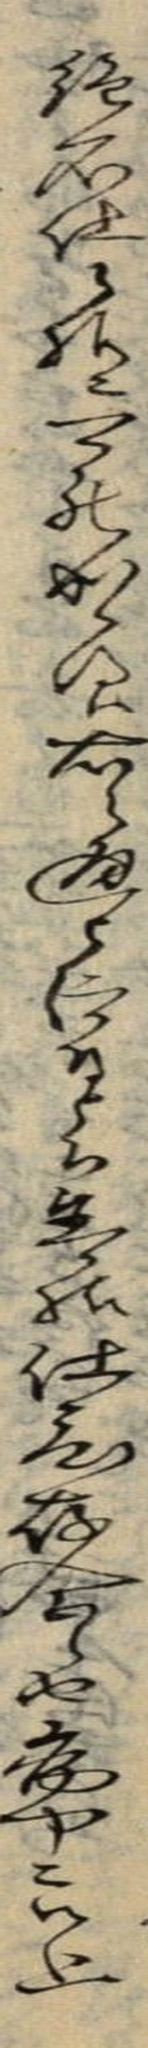絶不仕候様に可罷成候得は右之通被仰付被下置候様仕度存合之由病中に口上
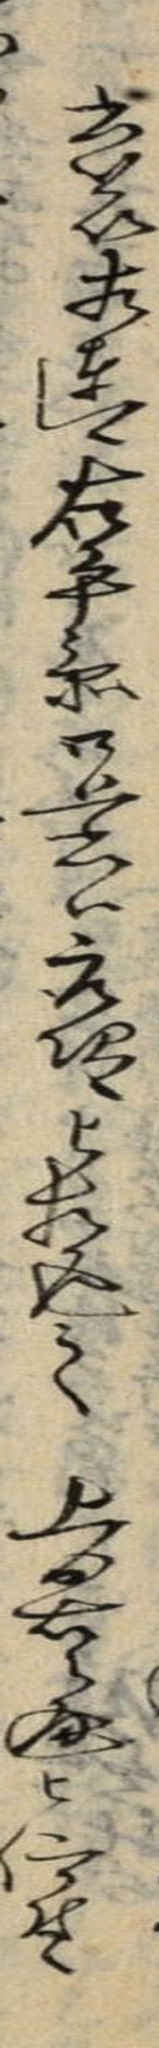書を以相達候右平兵衛口上書は取次へ被相返之上ゟ右之通被仰付候
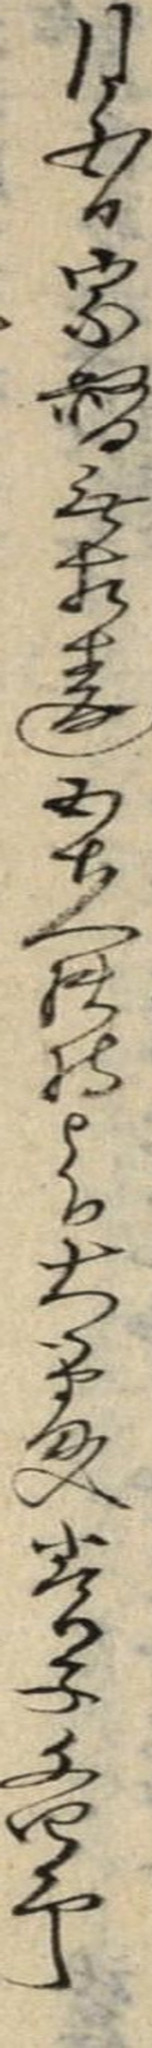月五日家督無相違五十人扶持被下大御番入養子文四郎
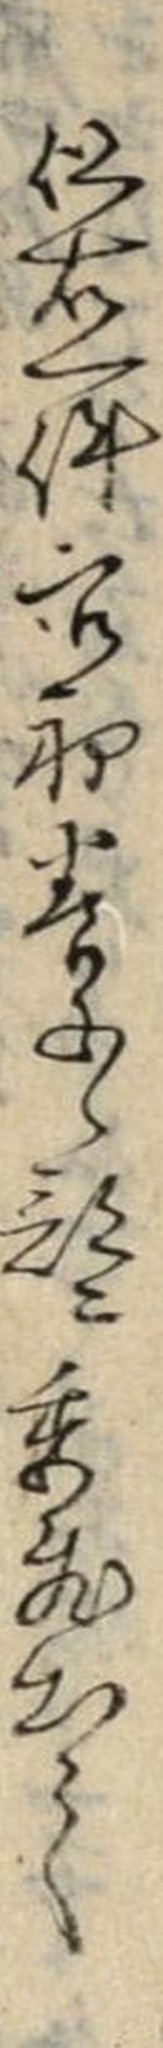但右一件最初養子之部に委敷出之
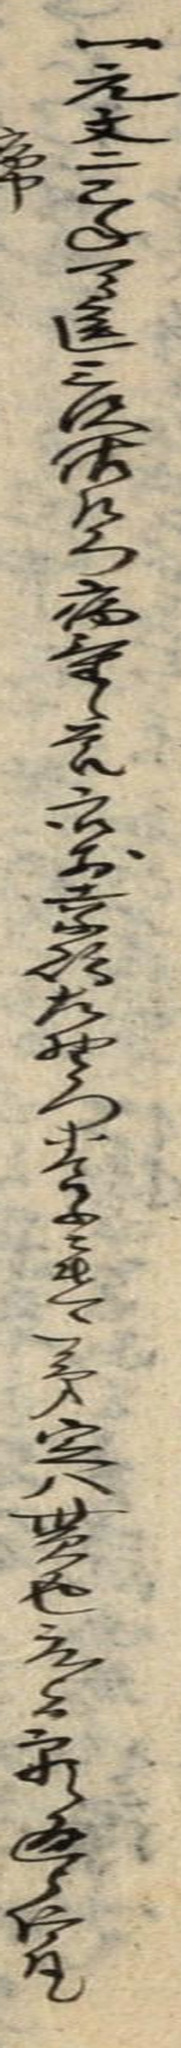一元文二巳年馬医三沢佐左衛門病気之節最前左野右衛門養子に遣候弟定八貰返度旨願之通被仰付候
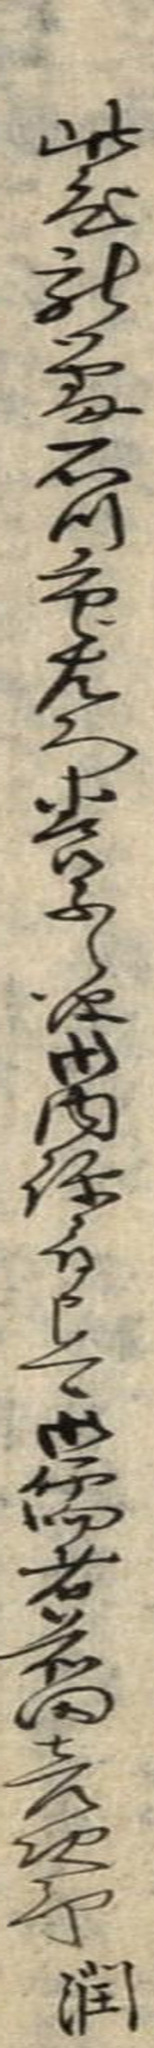一此度新御番石川市郎左衛門養子之儀御内評に付申上候御儒者前田彦次郎潤
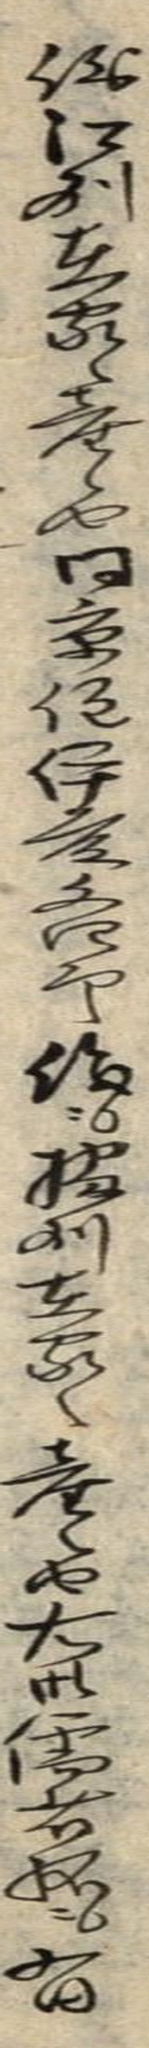儀江州在家へ産候由同京住伊藤文四郎儀も播州在家之産候由右御儒者抔も有
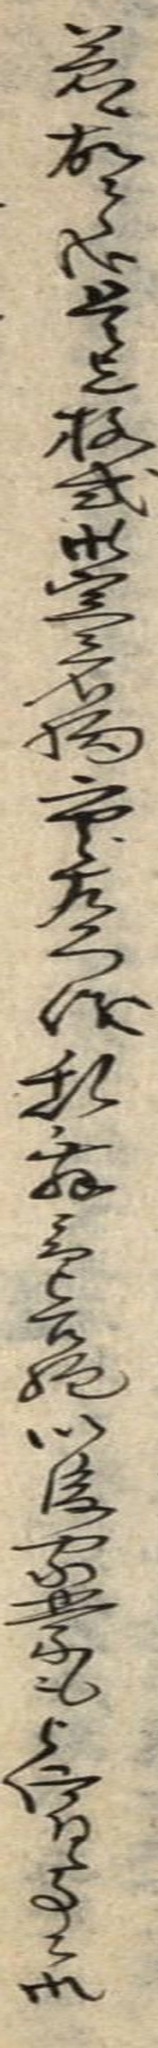兼候故に哉是迄格式御定に不拘市左衛門儀乱敷に而被召抱以後家業も被仰付候事に御
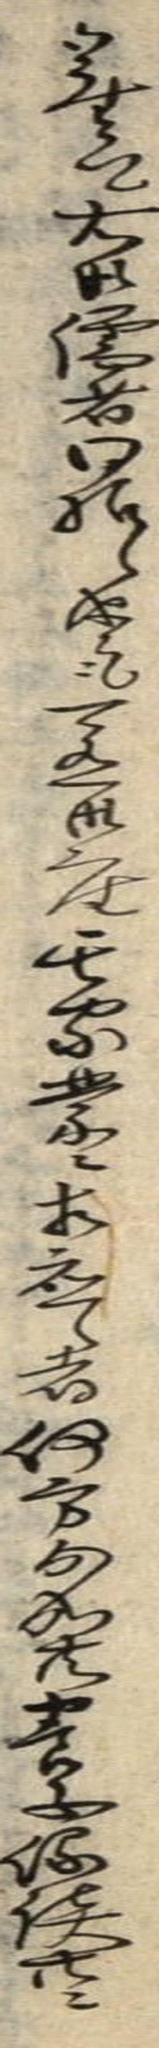座候はゝ右御儒者同様之儀にも可有御座其家業に相応之者何方ゟ成共養子縁談共に
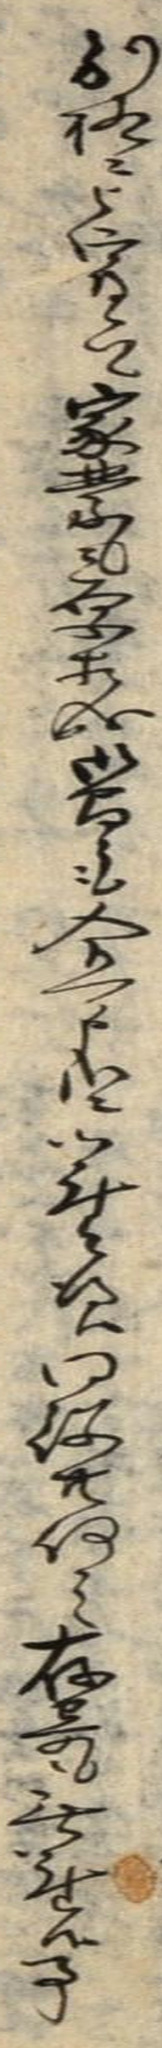別格に被仰付候はゝ家業も厚相成御間にも合可申哉に御座候得は同役共何之存寄も無御座候事

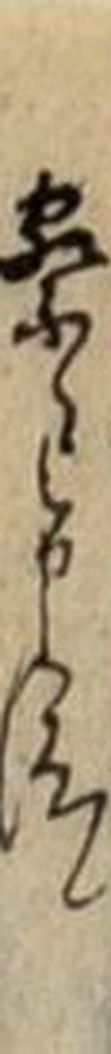察へ被申渡候
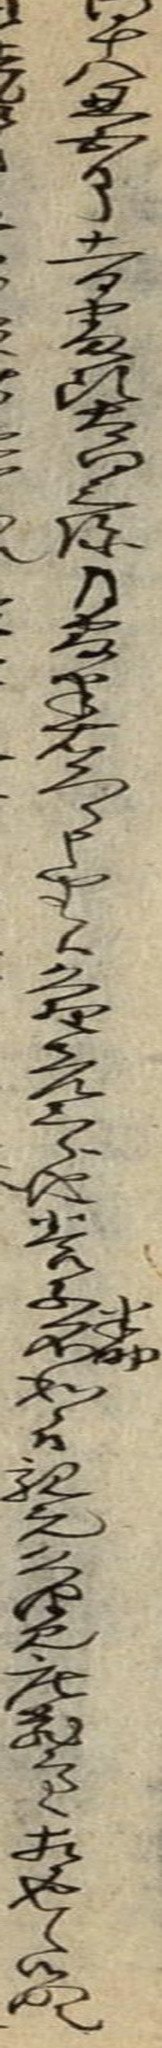一同十八丑五月十一日番頭太田三弥月番半右衛門へ申聞候は久野彦三郎儀養子半助不和に付親元久津見庄蔵方へ相返之候仍之
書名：養子縁組之部
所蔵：福井県文書館 Fukui Prefectural Archives
